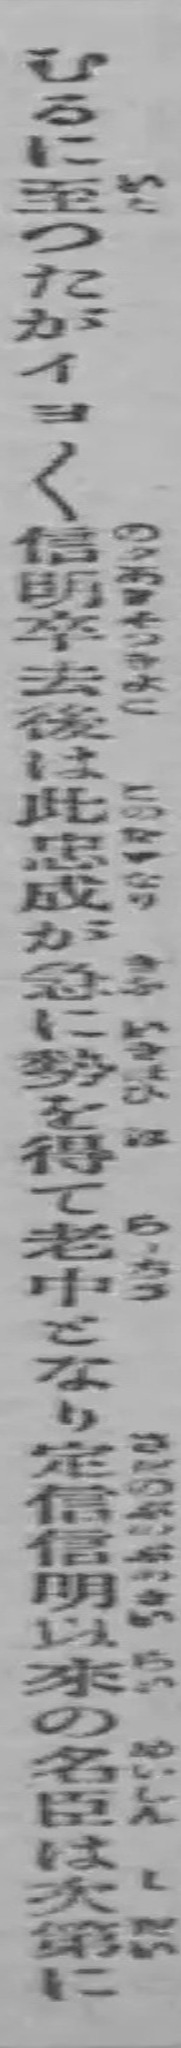むるに至つたがイヨ〳〵信明卒去後は此忠成が急に勢を得て老中となり定信信明以来の名臣は次第に
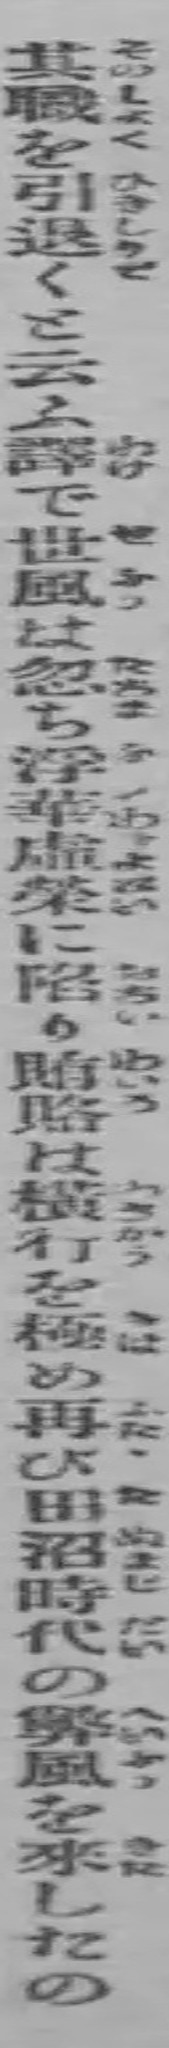其職を引退くと云ふ訳で世風は忽ち浮華虚栄に陥り賄賂は横行を極め再び田沼時代の弊風を来したの
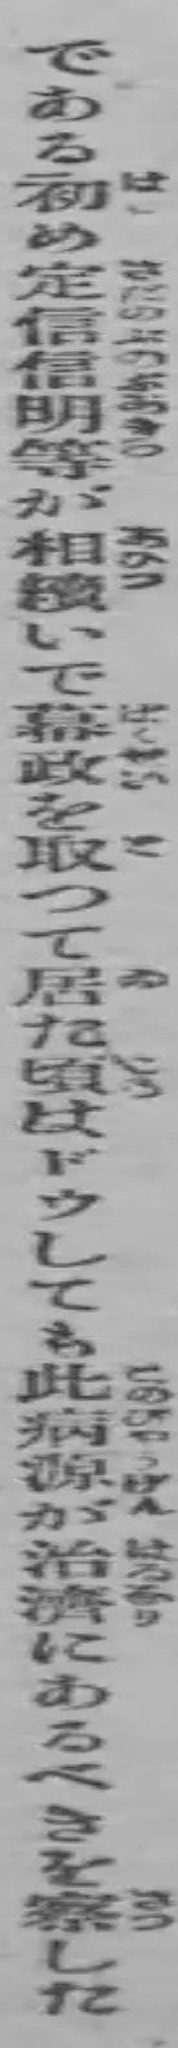である初め定信信明等が相続いで幕政を取つて居た頃はドウしても此病源が治済にあるべきを察した
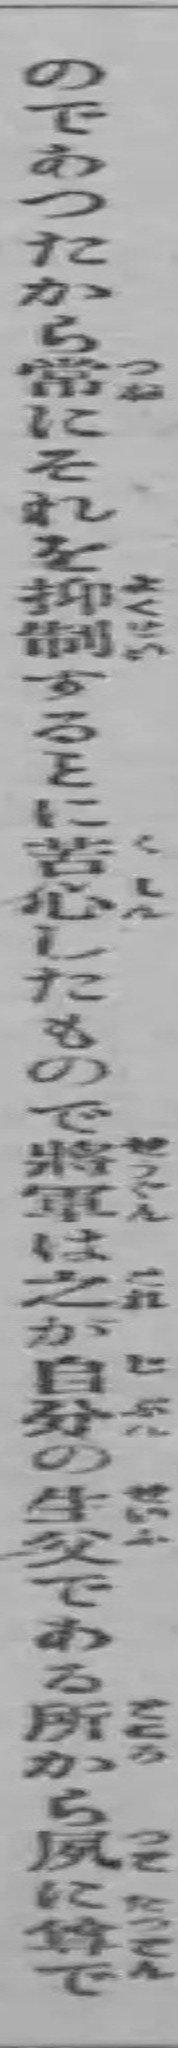のであつたから常にそれを抑制することに苦心したもので将軍は之が自分の生父である所から夙に尊で
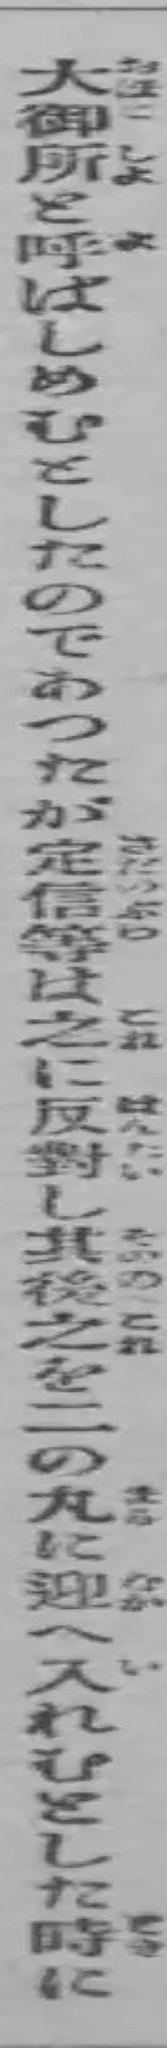大御所と呼ばしめむとしたのであつたが定信等は之に反対し其後之を二の丸に迎へ入れむとした時に
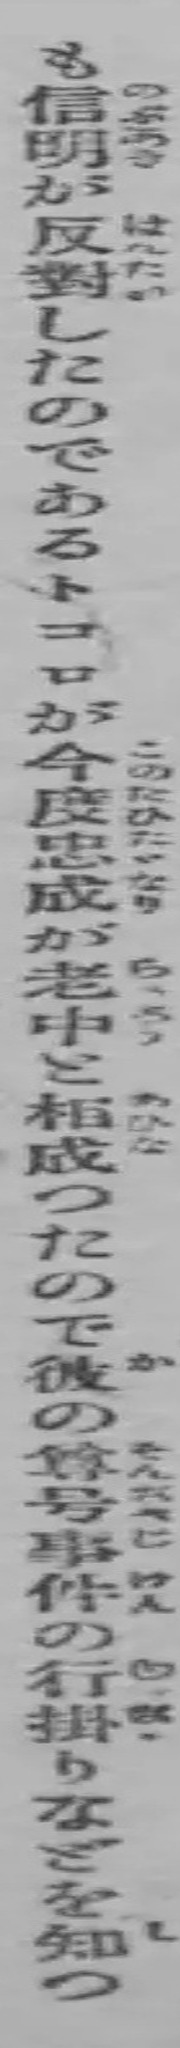も信明が反対したのであるトコロが今度忠成が老中と相成つたので彼の尊号事件の行掛りなどを知つ
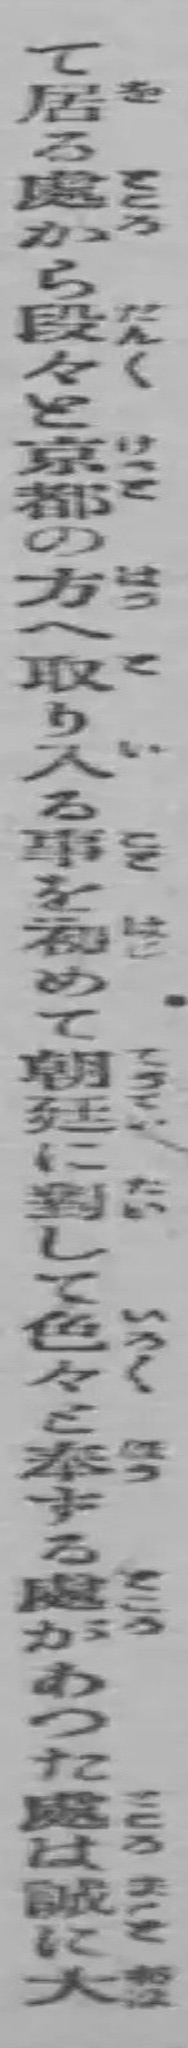て居る処から段々と京都の方へ取り入る事を初めて朝廷に対して色々と奉ずる処があつた処は誠に大
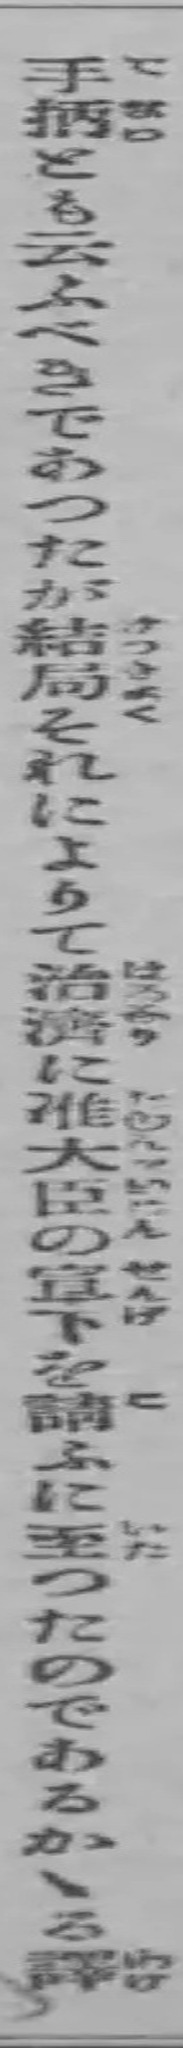手柄とも云ふべきであつたが結局それによりて治済に准大臣の宣下を請ふに至つたのであるかゝる訳
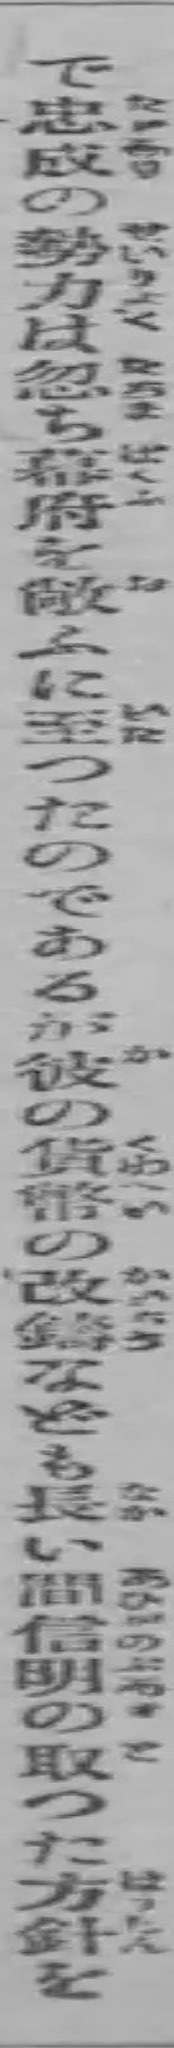で忠成の勢力は忽ち幕府を敞ふに至つたのであるが彼の貨幣の改鋳なども長い間信明の取つた方針を
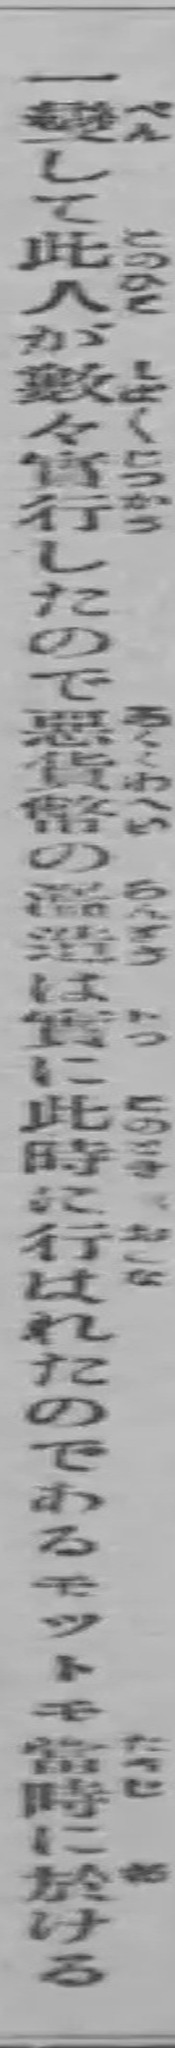一変して此人が屡々実行したので悪貨幣の濫造は実に此時に行はれたのであるモツトモ当時に於ける
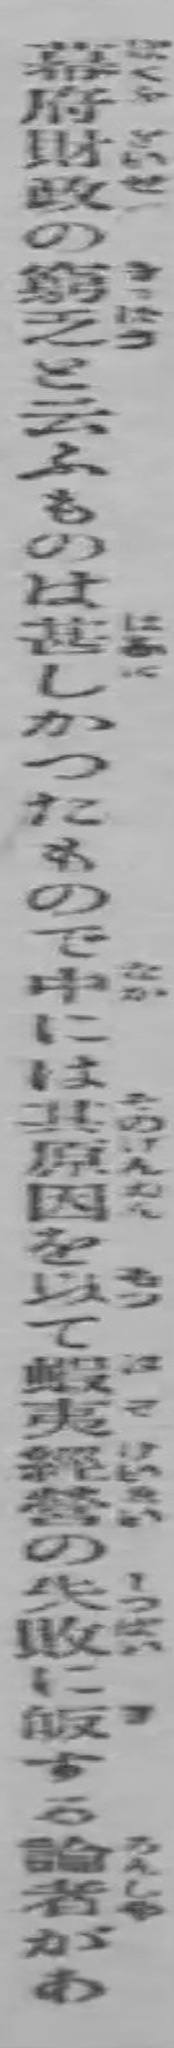幕府財政の窮乏と云ふものは甚しかつたもので中には其原因を以て蝦夷経営の失敗に皈する論者があ
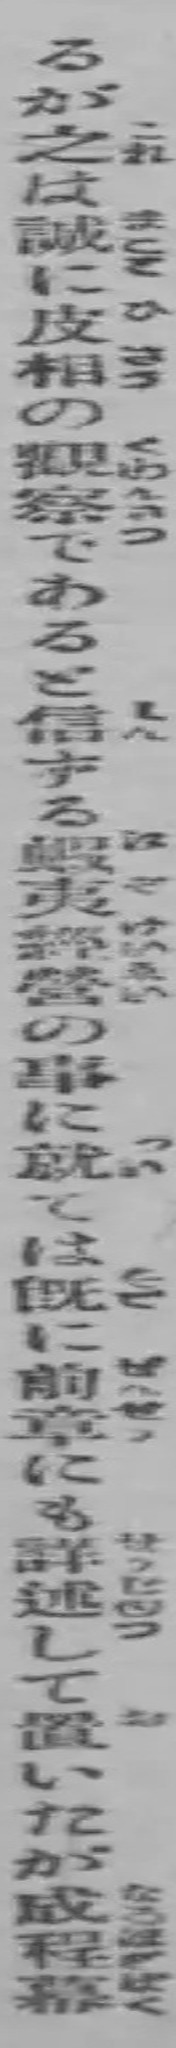るが之は誠に皮相の観察であると信ずる蝦夷経営の事に就ては既に前章にも詳述して置いたが成程幕
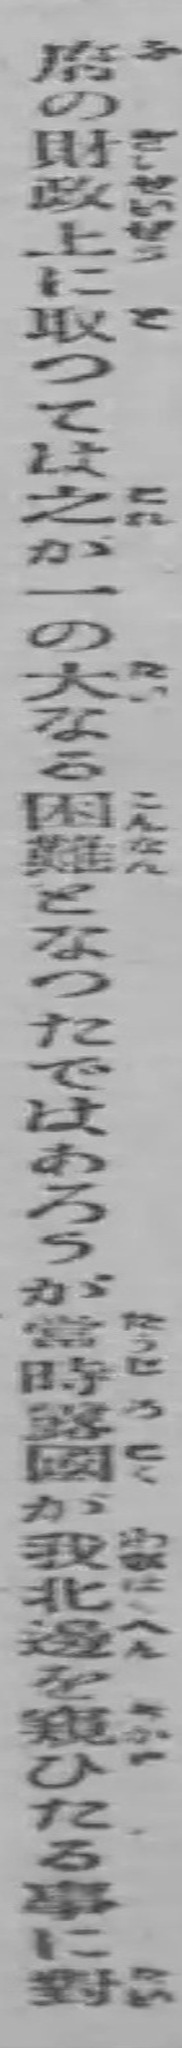府の財政上に取つては之が一の大なる困難となつたのではあろうが当時露国が我北辺を窺ひたる事に対
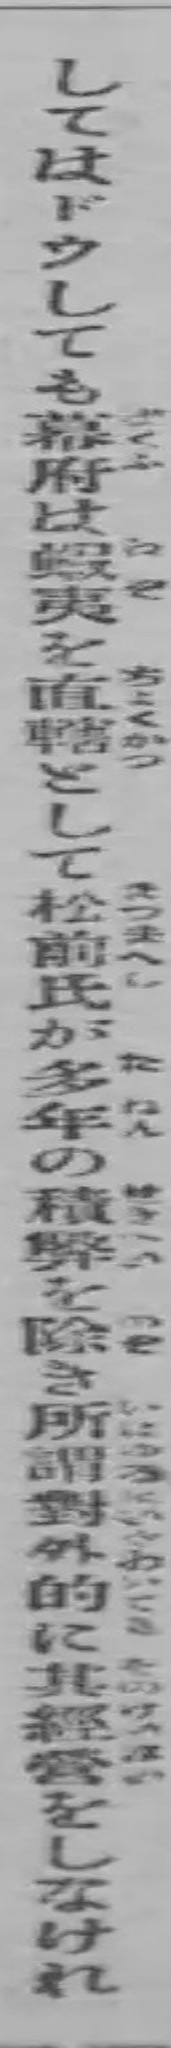してはドウしても幕府は蝦夷を直轄として松前氏が多年の積弊を除き所謂対外的に其経営をしなけれ
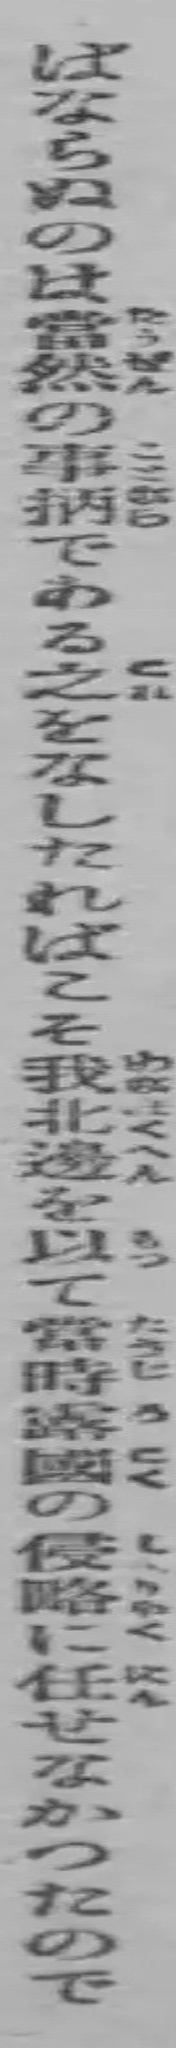ばならぬのは当然の事柄である之をなしたればこそ我北辺を以て当時露国の侵略に任せなかつたので
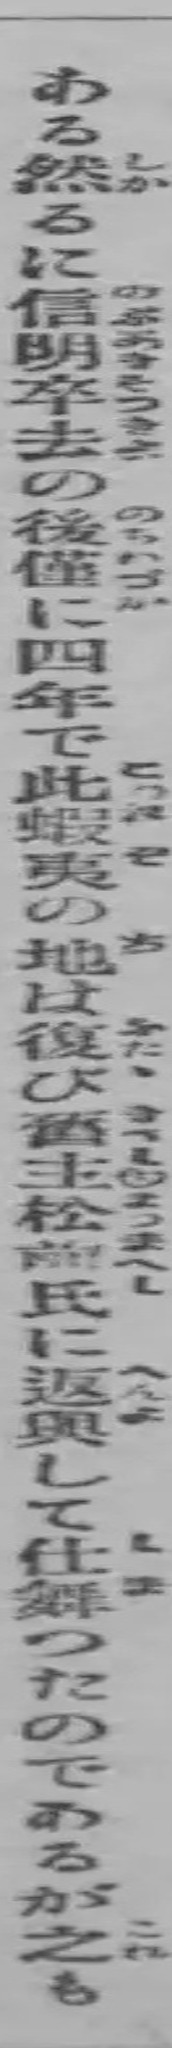ある然るに信明卒去の後僅に四年で此蝦夷の地は復び旧主松前氏に返与して仕舞つたのであるが之も
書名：豊橋市史談
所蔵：国立国会図書館 National Diet Library, JAPAN
